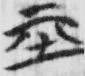○（基）
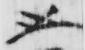之
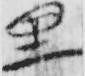里
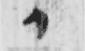人
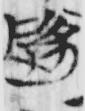墜
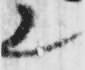乙
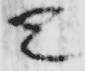巳
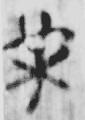某
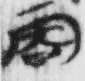丙
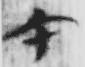午
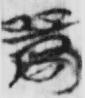單
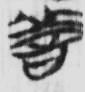善
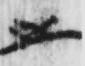之
